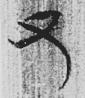又（有）
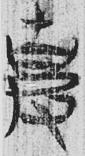尅
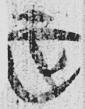正（政）
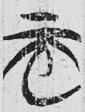而
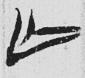亡
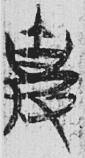尅
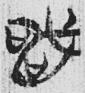○（陳）
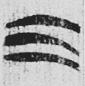三
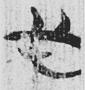弋（代）
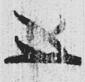之
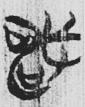○（陳）
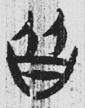皆
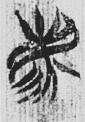○（存）
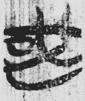或
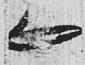㠯
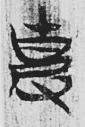尅
